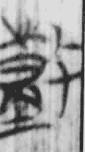○（勤）
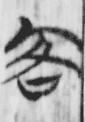客
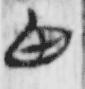甶（思）
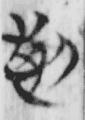○（斷）
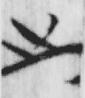之
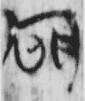含
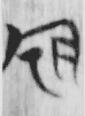陰
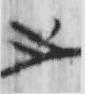之
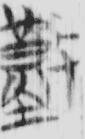○（勤）
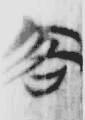客
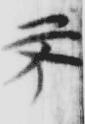不
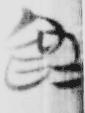爲
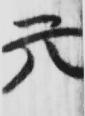亓（其）
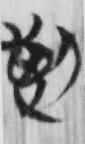○（斷）
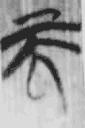而
